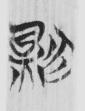則
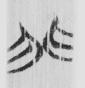非
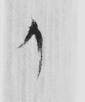人
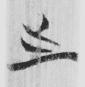之
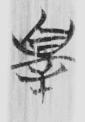辠
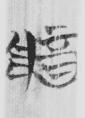𨟻
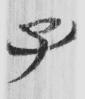子
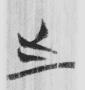之
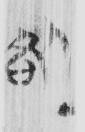咎
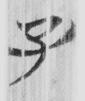子
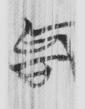{㠯ㅋ}
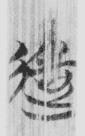造
